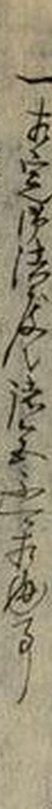一相定御法度之諸客不可相通事
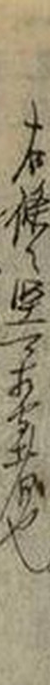右條々堅可相守者也
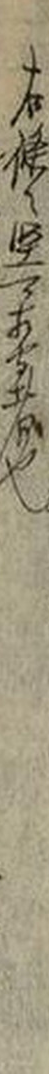右條々堅可相守者也
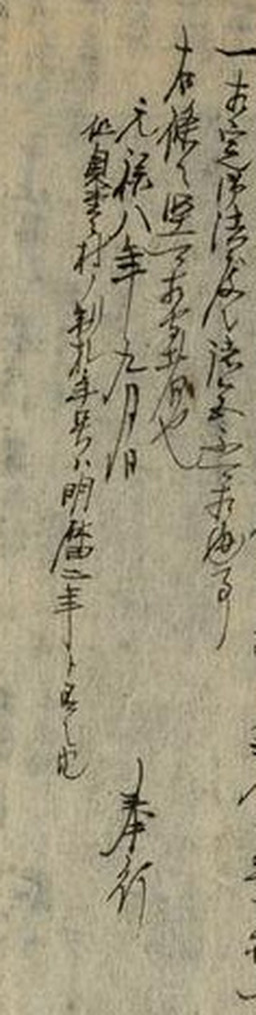元禄八年九月日奉行
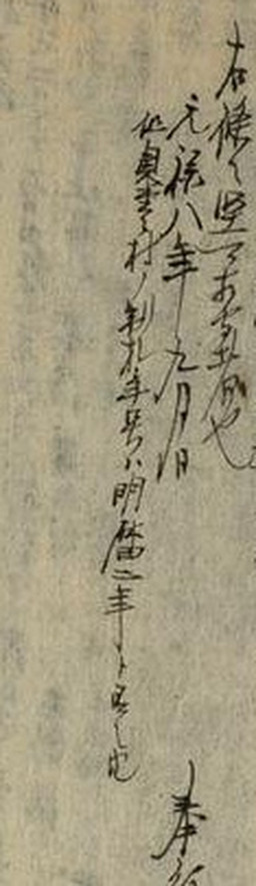但奥野々村ノ制札年号ハ明暦二年ト有之由

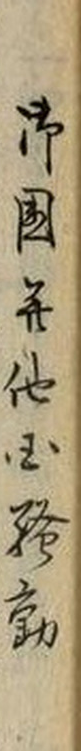御国幷他国騒動
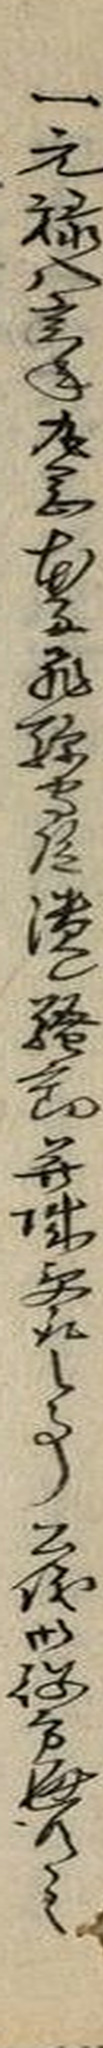一元禄八亥年丸岡本多飛騨守殿潰レ騒動幷城受取之事公儀御役方通行之
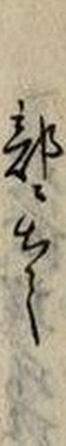部ニ出之
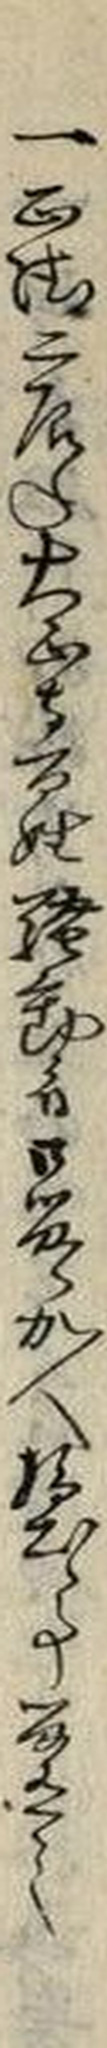一正徳二辰年大正寺百姓騒動ニ付御留候加人指出候事留有之
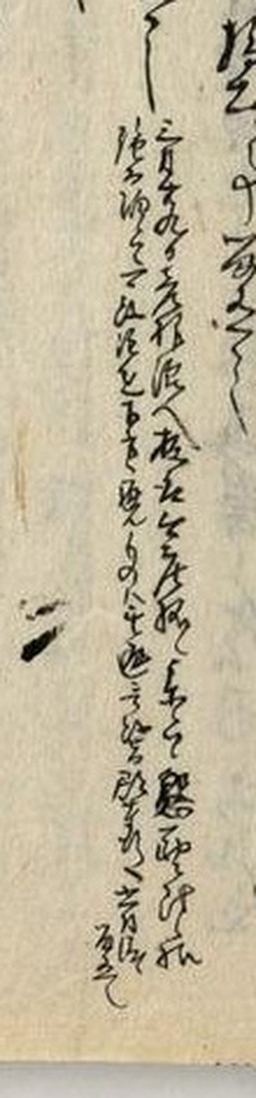強而泊候ハヽ可致注進下方へ通ルものハ其通ニ可致旨郡奉行へ書付渡候留有之
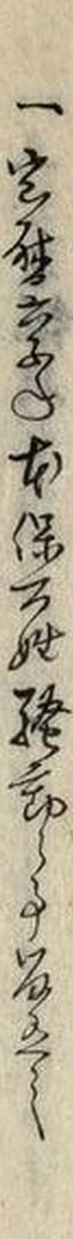一宝暦六子年本保百姓騒動之事留有之
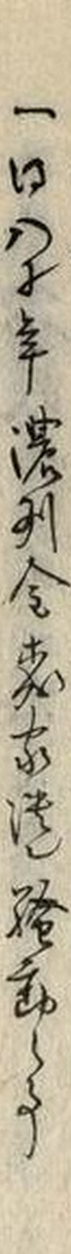一同八寅年濃州金森家潰レ騒動之事
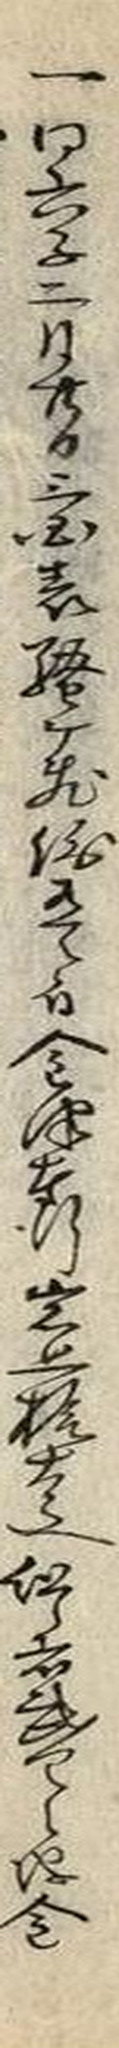一同六子二月廿日三国表騒ケ敷儀有之ニ付金津奉行岩上梶太夫組之者武具之儀金
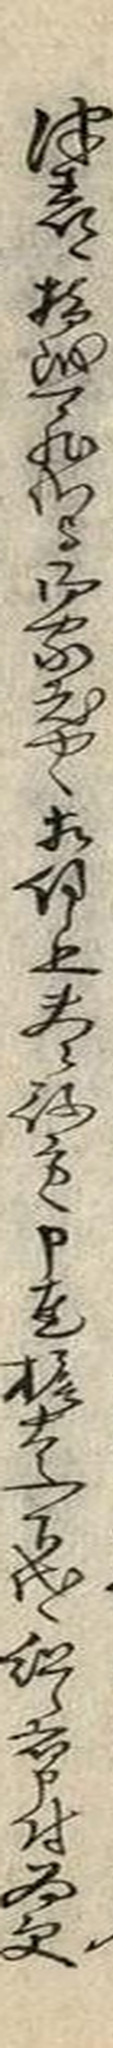津表へ指越可然哉与御家老中へ相伺候上夫々役方へ申達梶太夫下代へ組之者申付為受
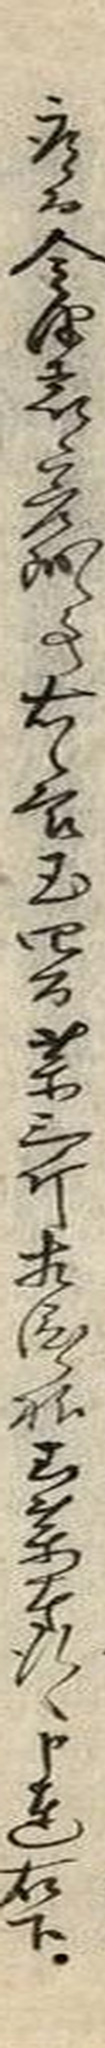取候而金津表へ差越候事右之節玉四百薬三斤相渡候様玉薬奉行へ申達右下
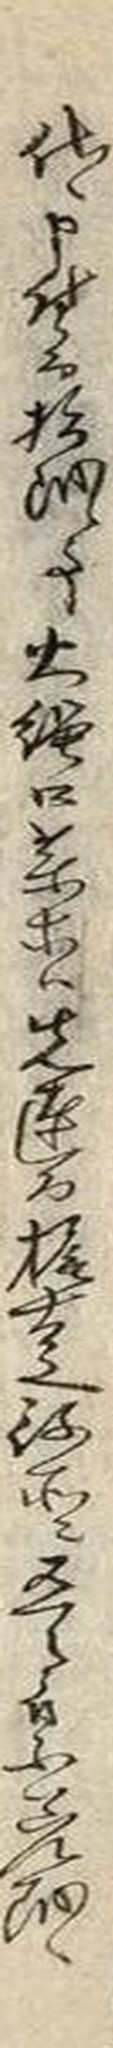代へ申付候而指越候事火縄口薬等ハ先達而梶太夫役所ニ有之ニ付不差越候
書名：御国他国諸事之部
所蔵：福井県文書館 Fukui Prefectural Archives
